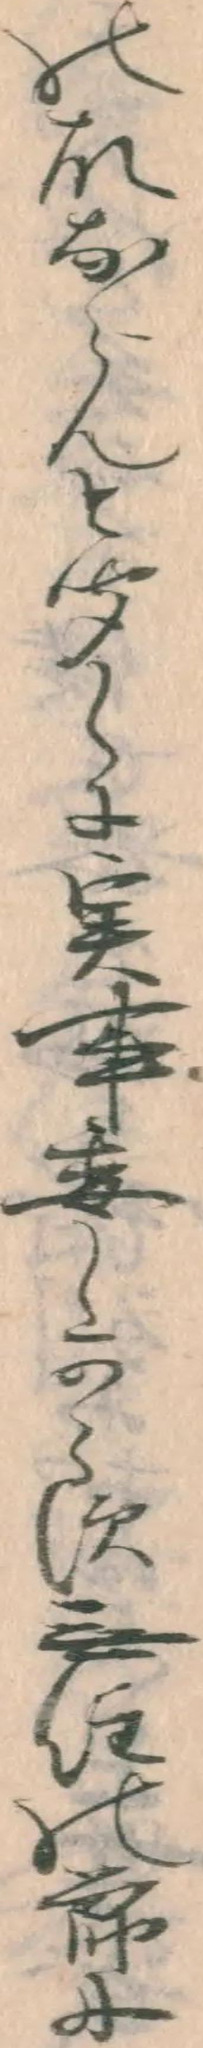の故ならんと聞しに実事委しからす無住の節に
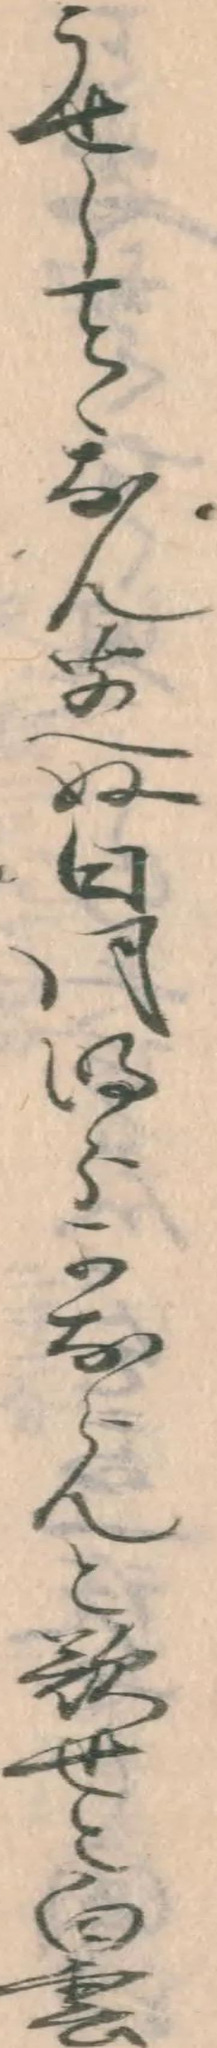うせしことゝなん聞へぬ日月明らかならんと欲せと白雲
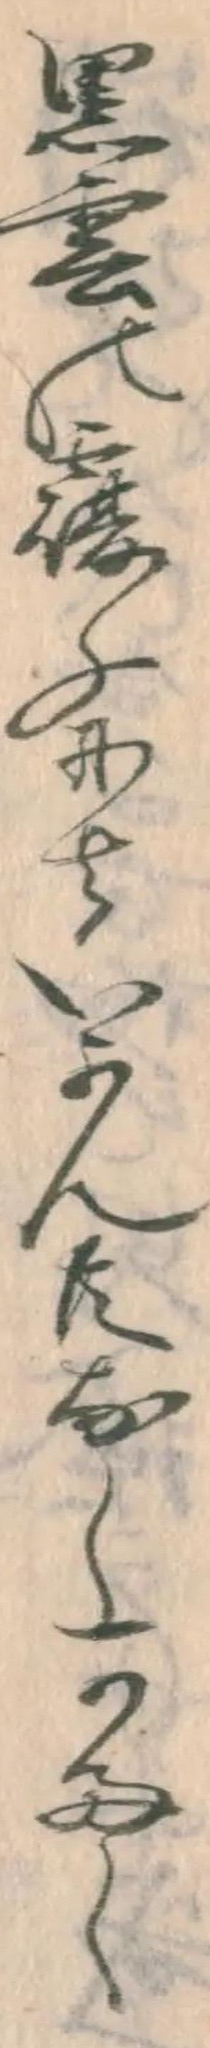黒雲の覆ふにはいかん共なしかたし
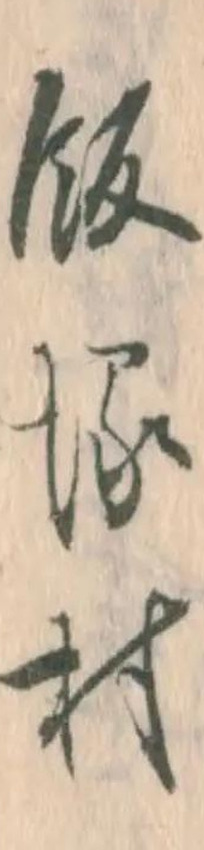飯塚村
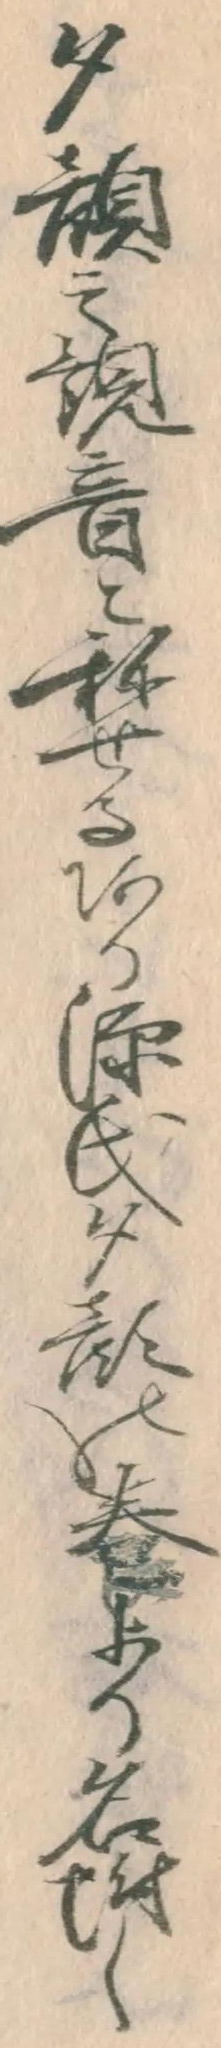夕顔之観音と称せるあり源氏夕顔の巻より名附し
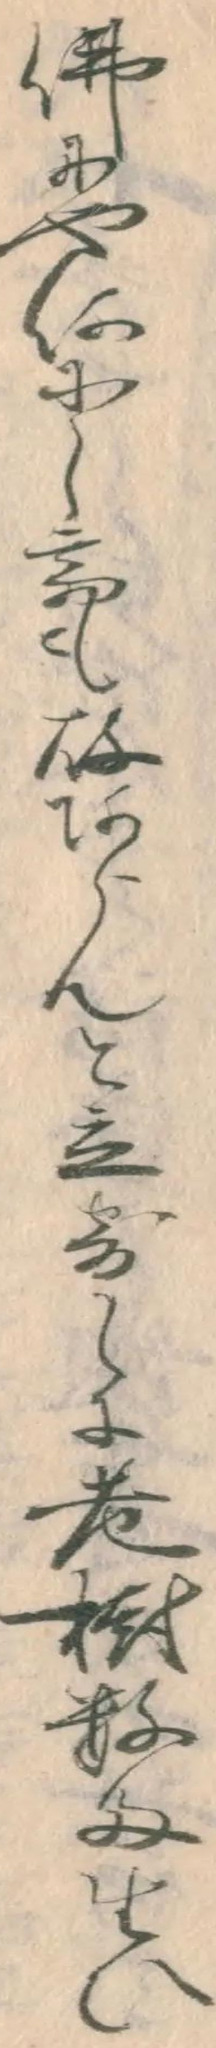仏にや何にしても故あらんと立寄しに老樹数多生ひ
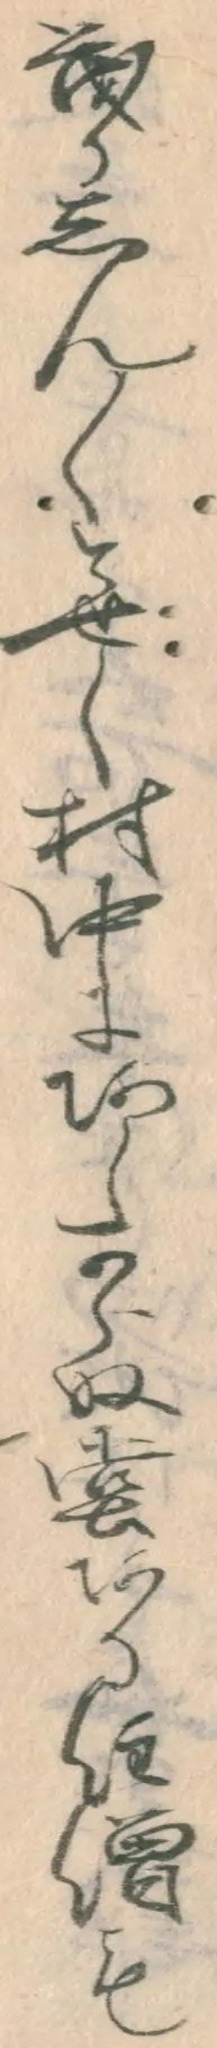茂りしん〳〵とせし村中にあしからぬ堂あり住僧も
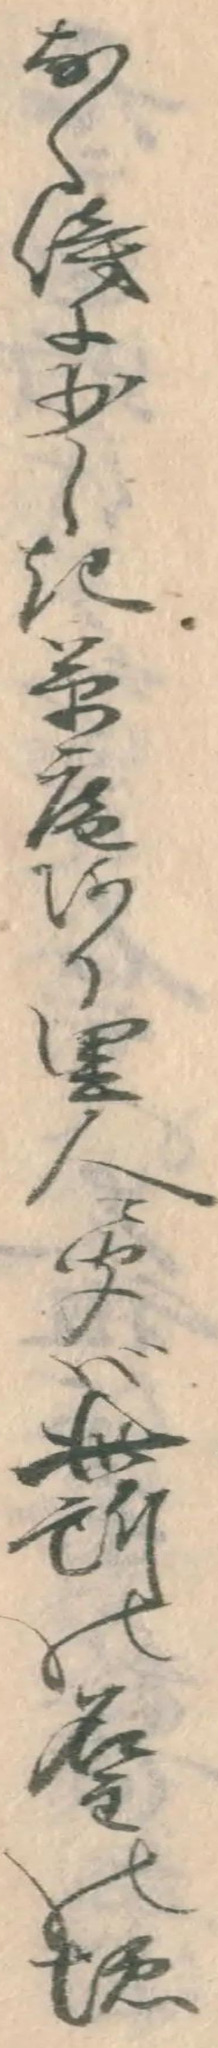なく傍に少しき草庵あり里人に聞ば此所の名主の隠

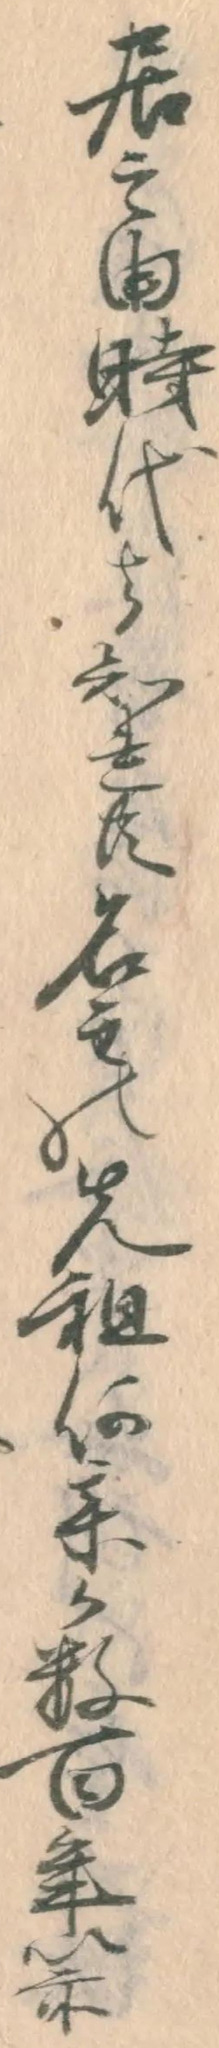居之由時代は知れ共名主の先祖何某か数百年以前
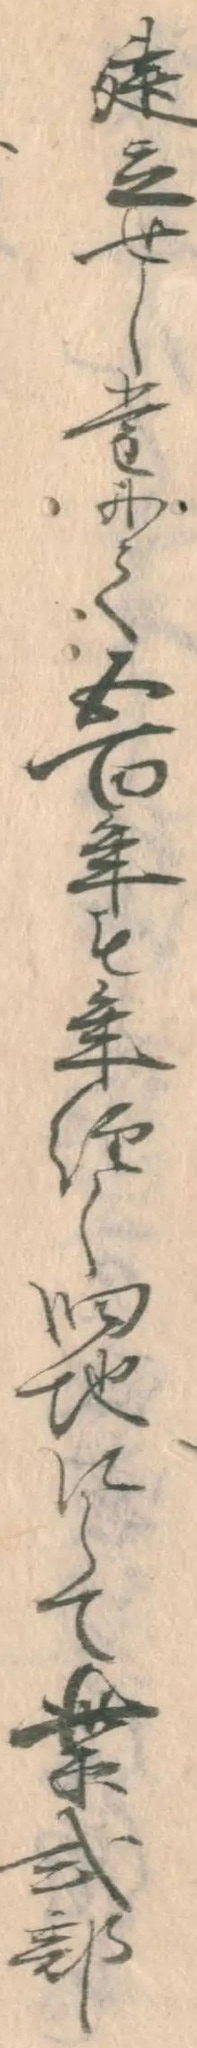建立せし堂にて五百年も年経し旧地にして紫式部
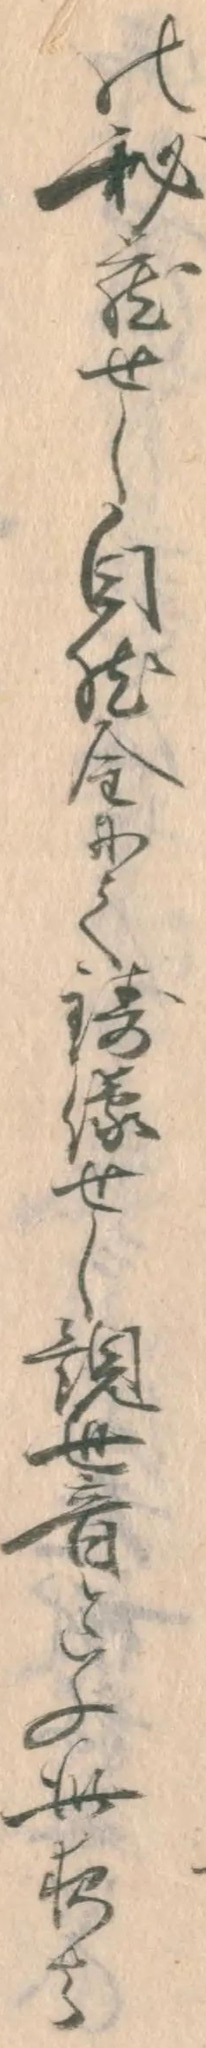の秘蔵せし自然金にて鋳像せし観世音といふ此夜は
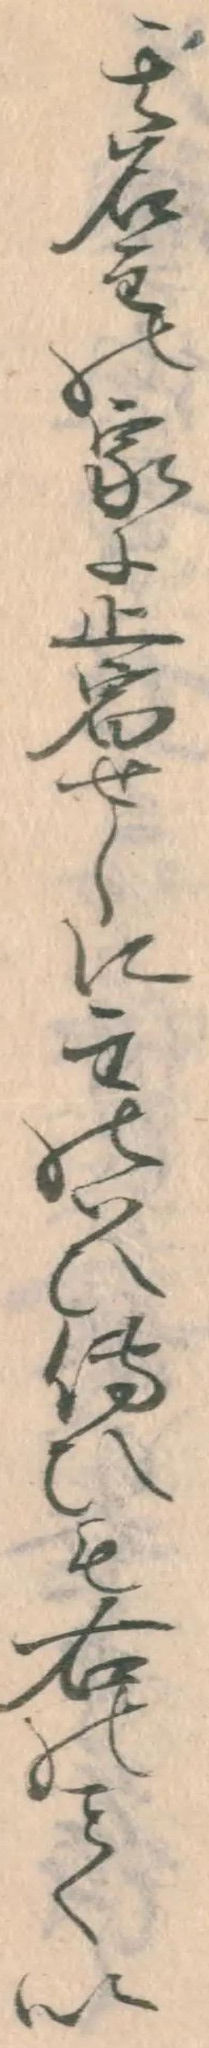其名主の家に止宿せしに主のいひ伝ひも右のことくい
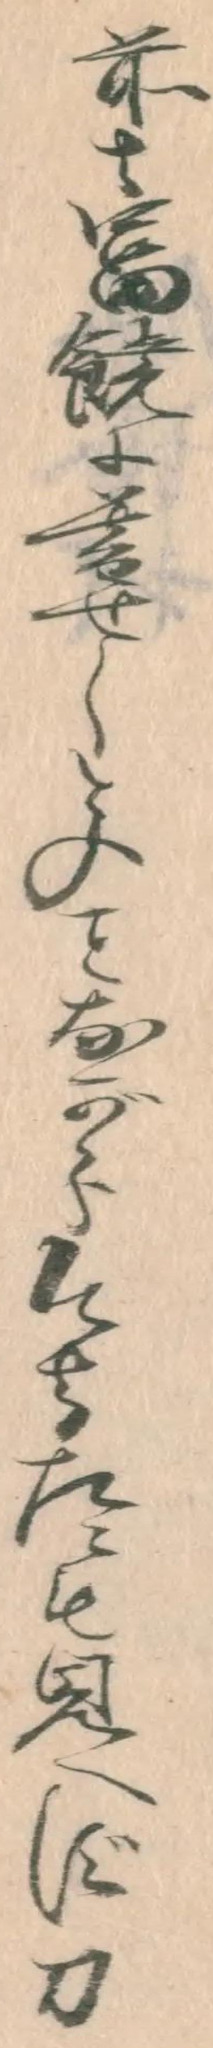前は富饒に暮せしとのことながら今はさにも見へず刀
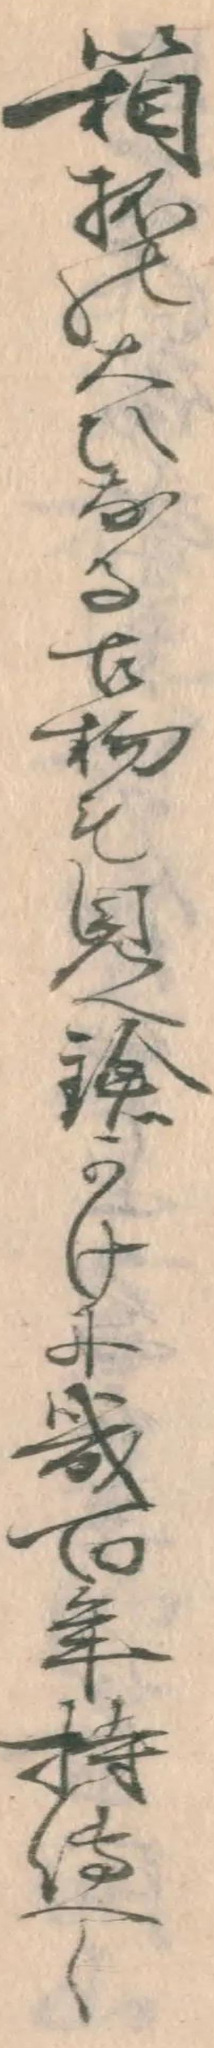箱抔の大ひなる古物も見へ鎗かけに幾百年持伝へし
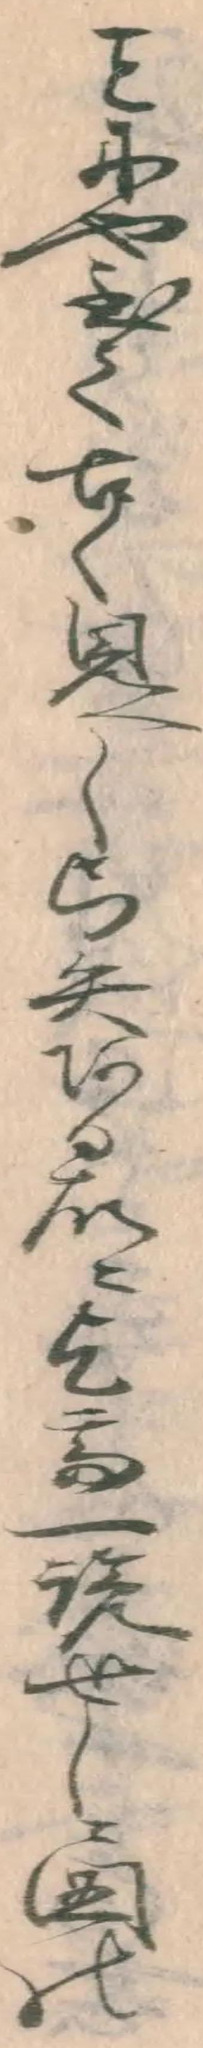ことにや至て古く見へし弓矢ある故に乞て一覧せしに図の
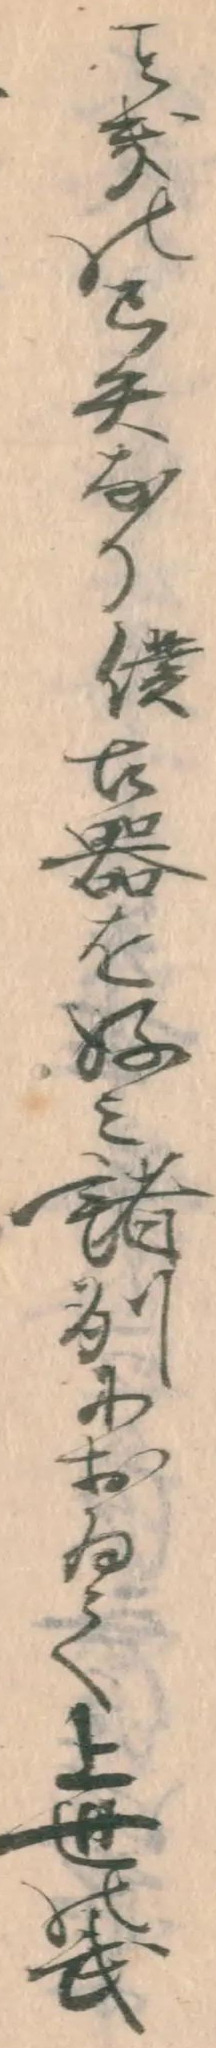こときの弓矢なり僕古器を好み諸州におゐて上世の武
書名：四神地名録 6巻. [4]葛飾郡
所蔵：国立国会図書館 National Diet Library, JAPAN
